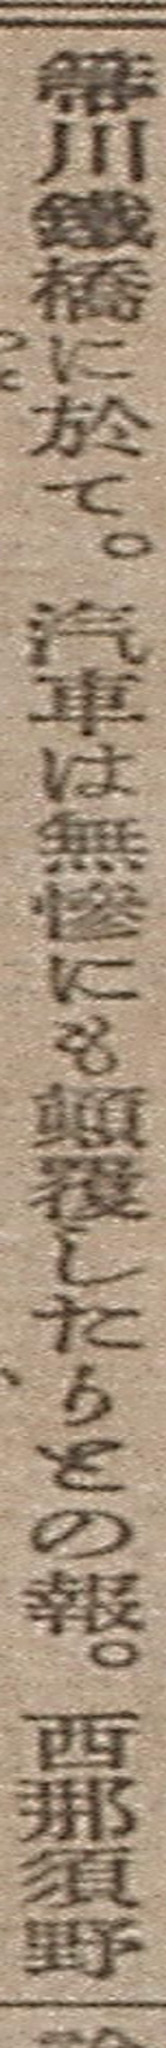箒川鉄橋に於て。汽車は無惨にも顛覆したりとの報。西那須野
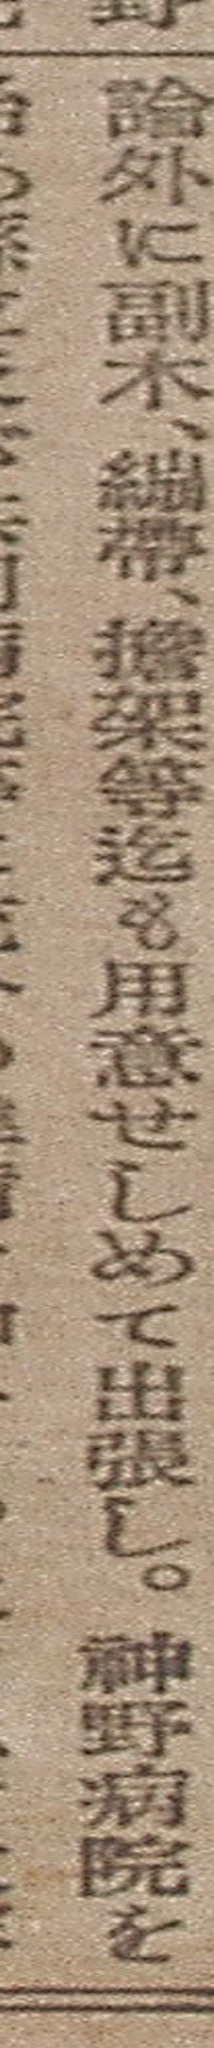論外に副木、繃帯、担架等迄も用意せしめて出張し。神野病院を
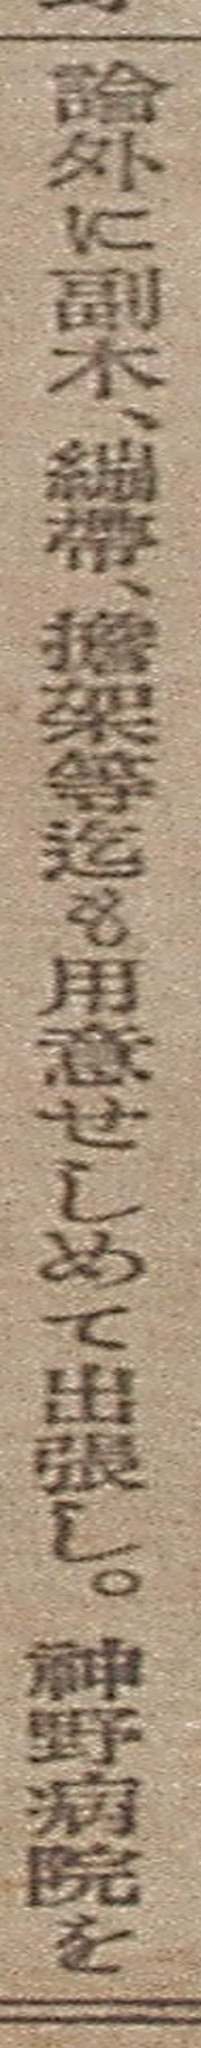論外に副木、繃帯、担架等迄も用意せしめて出張し。神野病院を
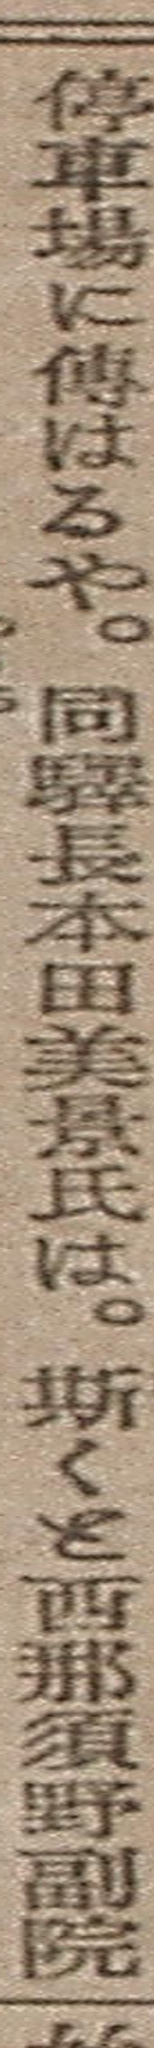停車場に伝はるや。同駅長本田美景氏は。斯くと西那須野副院
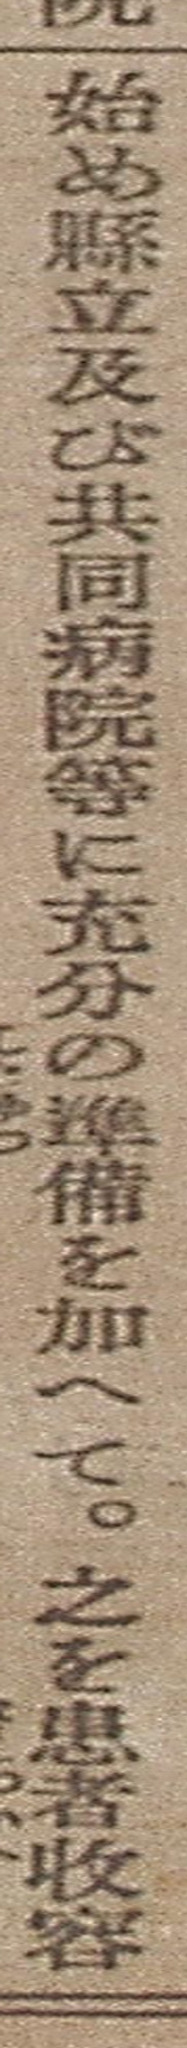始め県立及び共同病院等に充分の準備を加へて。之を患者収容
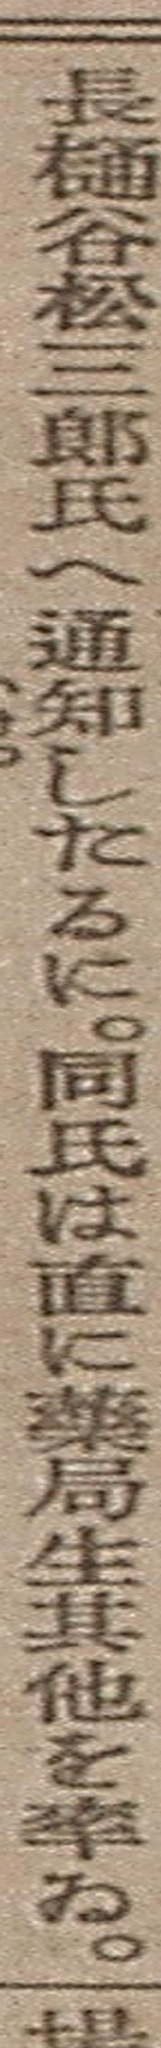長樋谷松三郎氏へ通知したるに。同氏は直に薬局生其他を率ゐ。
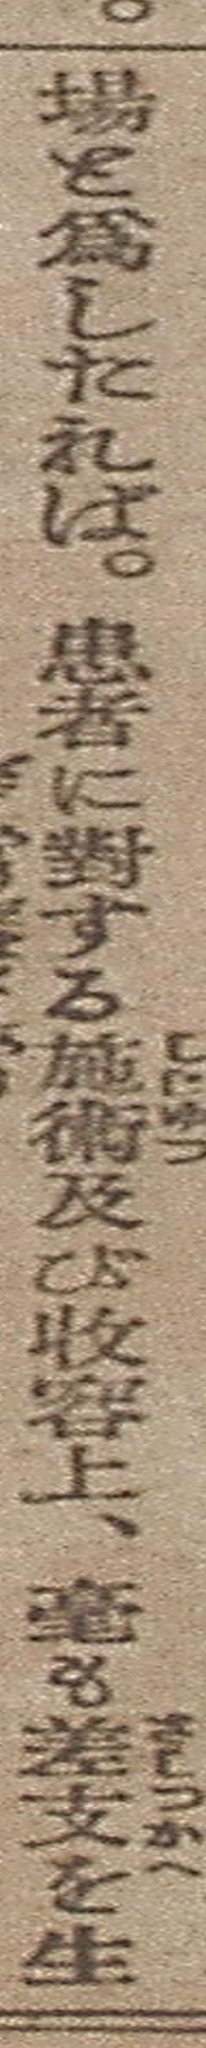場と為したれば。患者に対する施術及び収容上、毫も差支を生
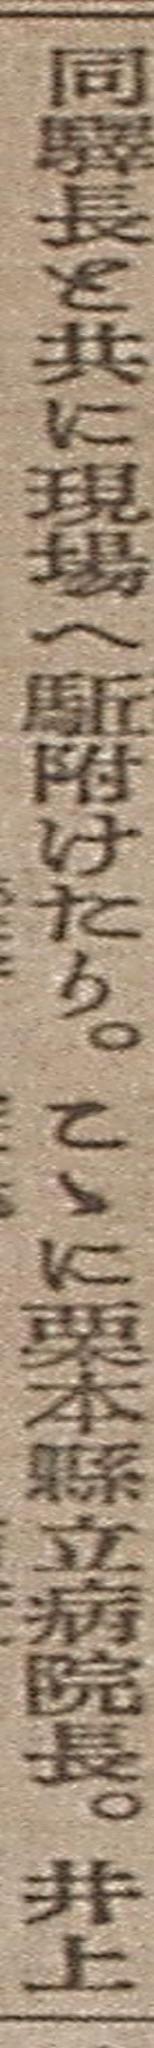同駅長と共に現場へ駈附けたり。こゝに栗本県立病院長。井上
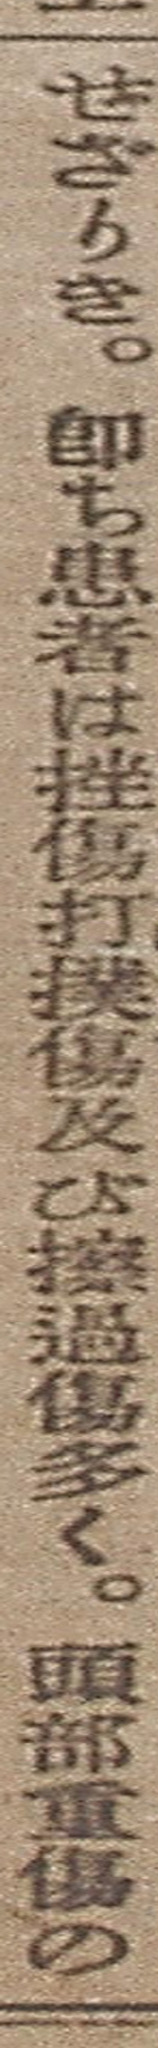せざりき。即ち患者は挫傷打撲傷及び擦過傷多く。頭部重傷の
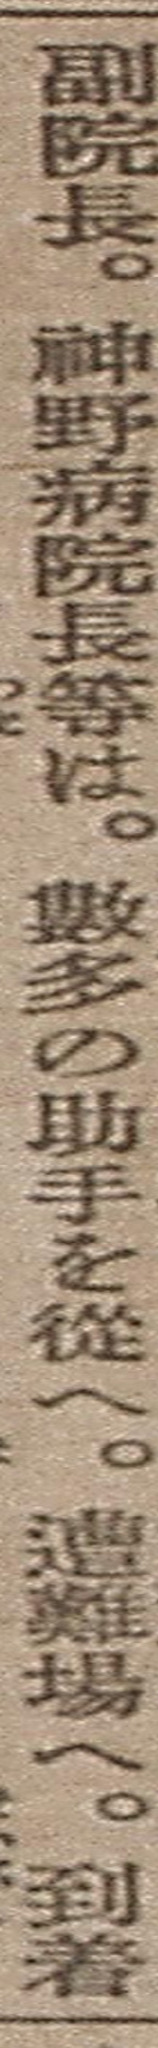副院長。神野病院長等は。数多の助手を従へ。遭難場へ。到着
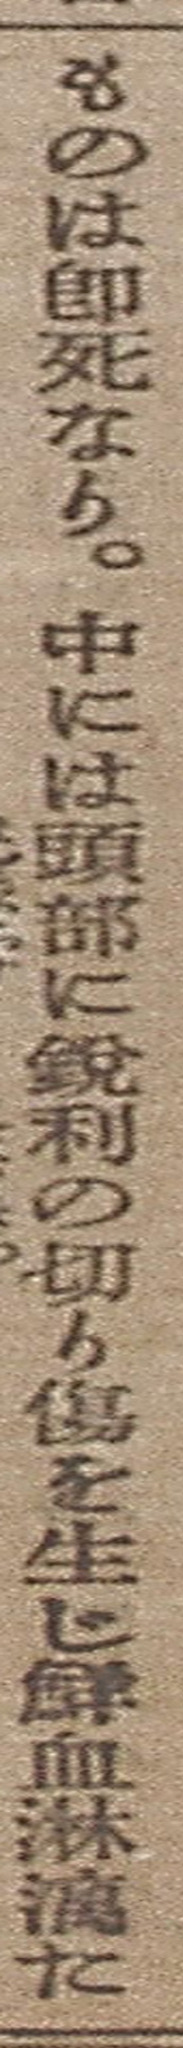ものは即死なり。中には頭部に鋭利の切り傷を生じ鮮血淋漓た
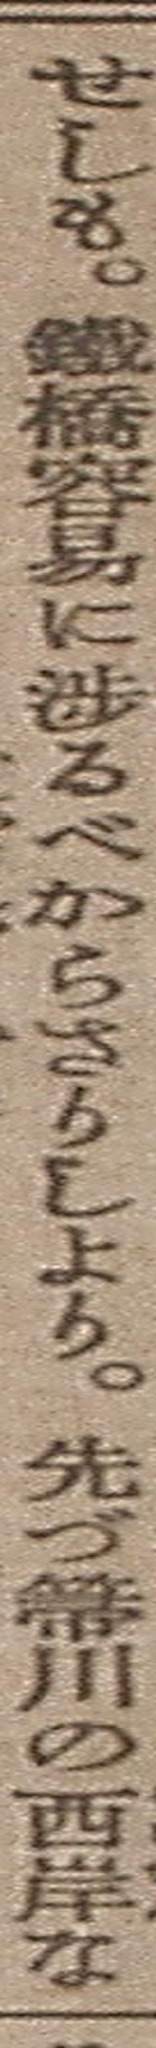せしも。鉄橋容易に渉るべからさりしより。先づ箒川の西岸な
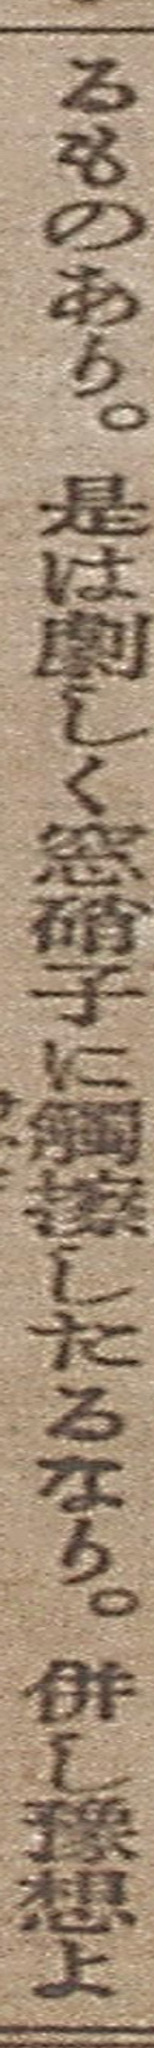るものあり。是は劇しく窓硝子に触擦したるなり。併し予想よ
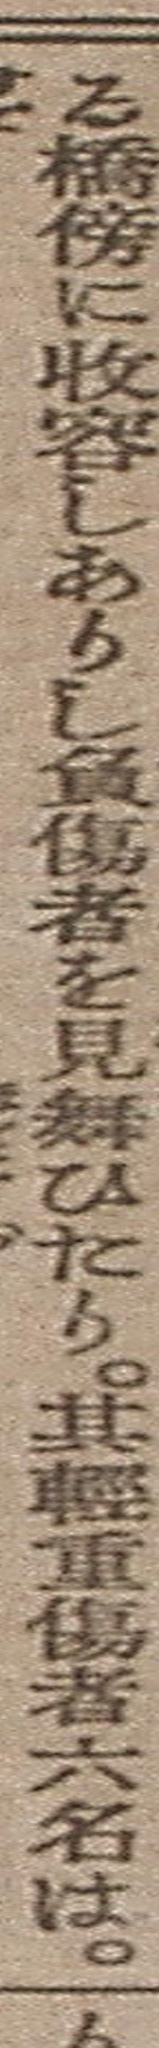る橋傍に収容しありし負傷者を見舞ひたり。其軽重傷者六名は。
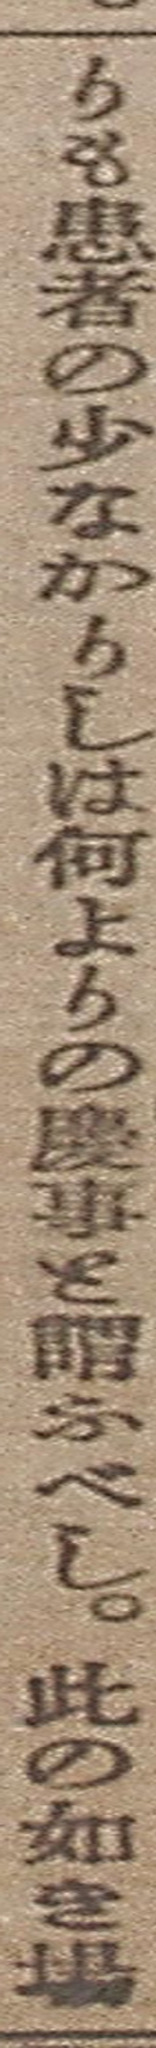りも患者の少なかりしは何よりの慶事と謂ふべし。此の如き場
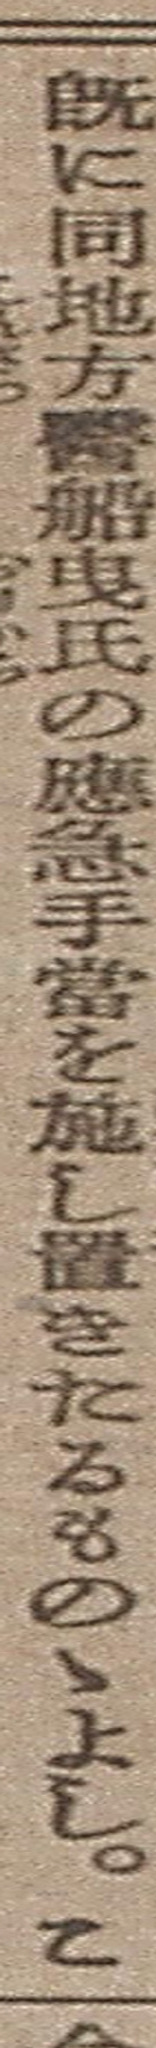既に同地方医船曳氏の応急手当を施し置きたるものゝよし。こ
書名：風俗畫報臨時増刊第百九十九號　明治三十二年十月各地災害圖會（前編之續）
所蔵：東京大学地震研究所図書室 Earthquake Research Institute Library, The University of Tokyo, JAPAN
